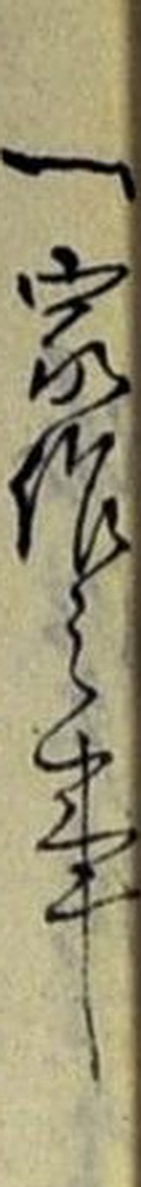一家作之事
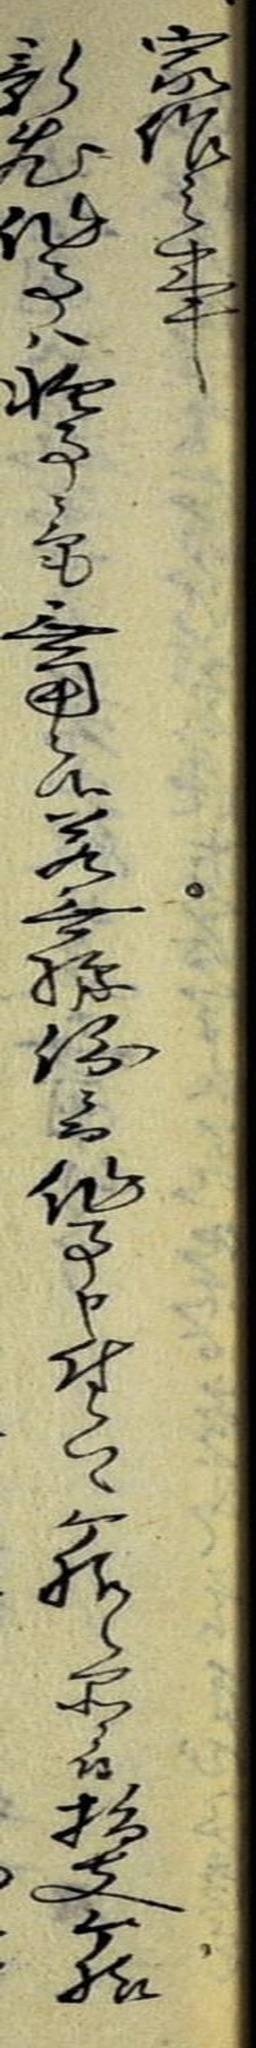新敷作事ハ軽事ニ而も無用ニ候若無拠儀ニ而作事申付候ハヽケ様之品ニ付指支ケ様
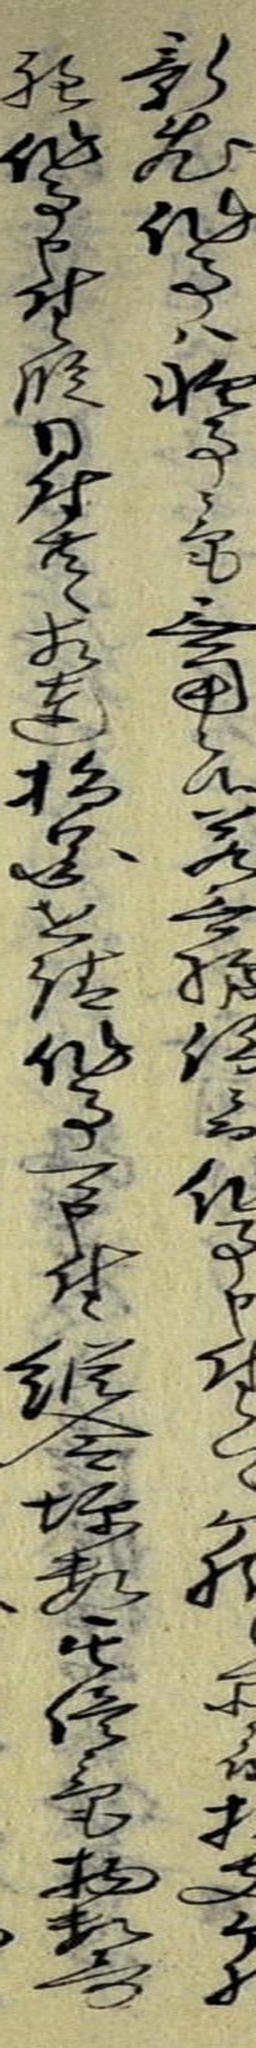程作事申付候段目付共ヘ相達指図を請作事可申付候縦令坪数其儘ニ而も物数奇
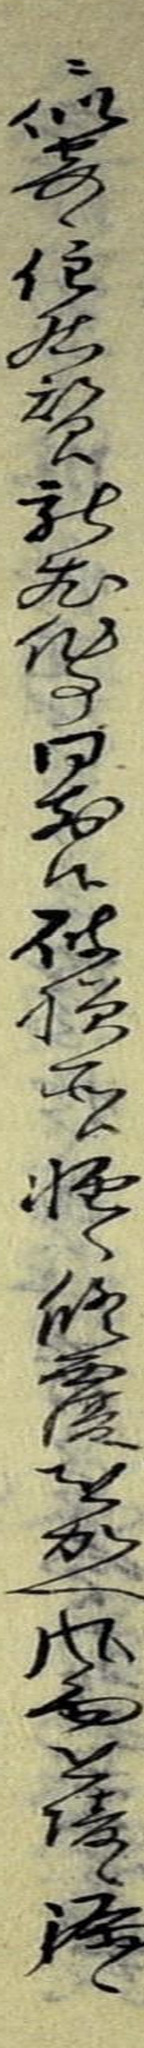ニ似寄候住居替ハ新敷作事同前候破損所ハ軽く修覆を加へ風雨を凌候漏候
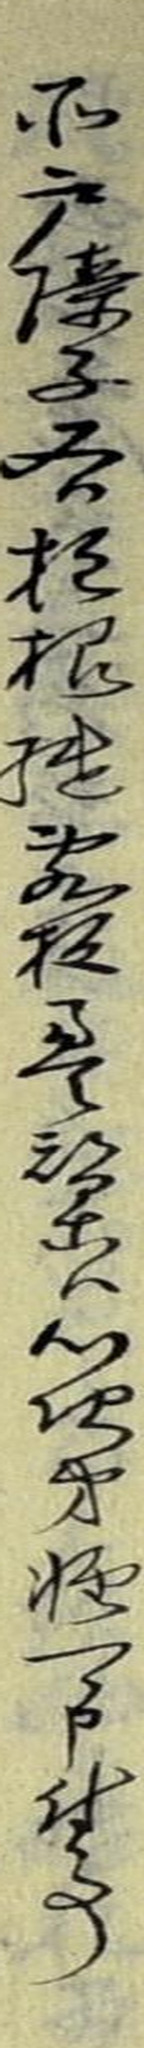所戸障子又ハ柱根継敷板畳替等ハ心次第軽可申付事
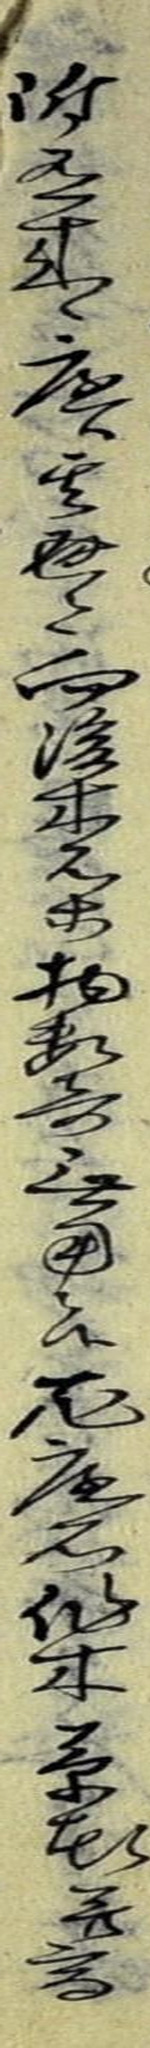附有来候庭ハ其通ニ候向後木石等物数奇無用ニ候尤庭石作木草花并高
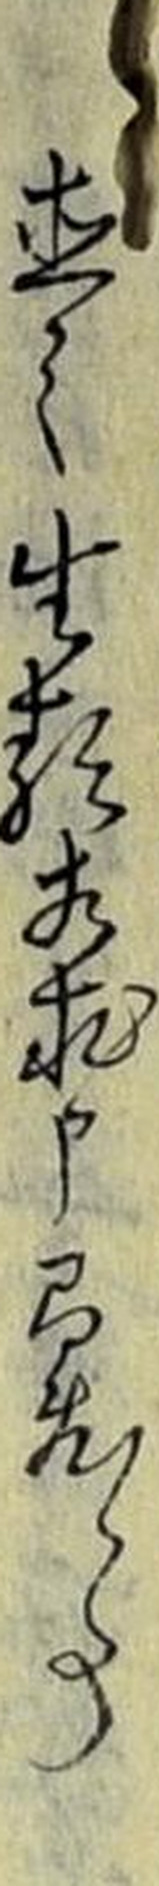直之生類相求申間敷候事
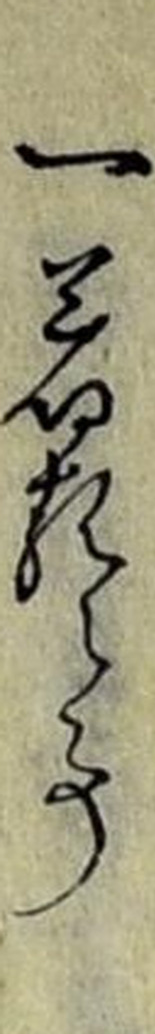一着類之事
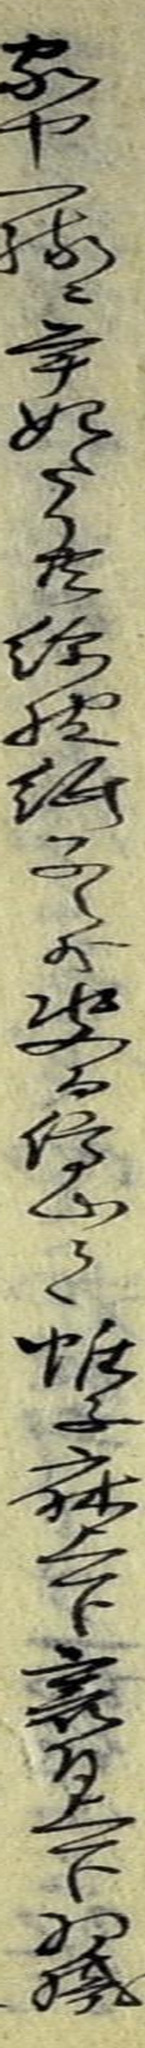家中一統ニ年始たり共綿服紙子之外決而停止ニ候帷子麻上下裏付上下羽織
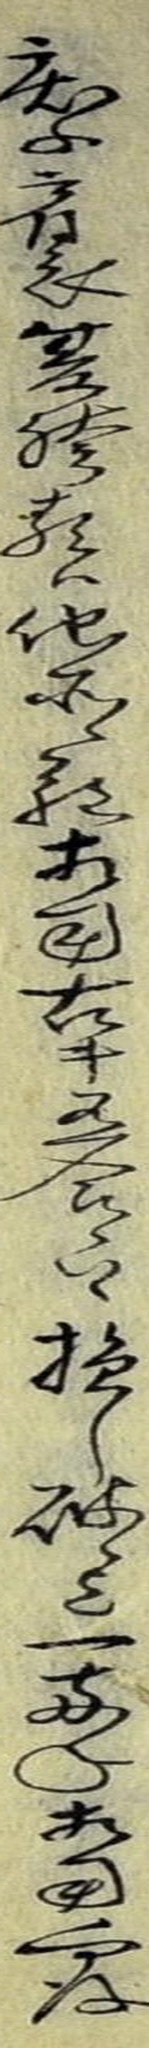戻子肩衣夏袴類ハ他所へ難相用古キ有合候ハヽ損し破候迄一両年相用向後
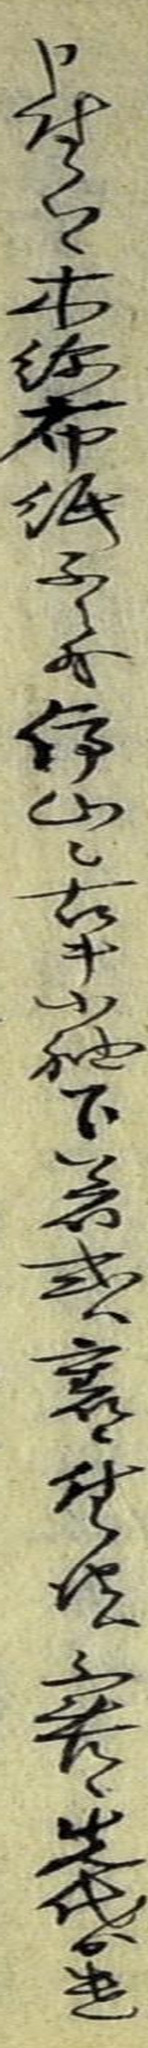申付候ハヽ木綿布紙子之外停止候古キ小袖下着或ハ裏ニ付候儀ハ不苦候先代ゟ遣
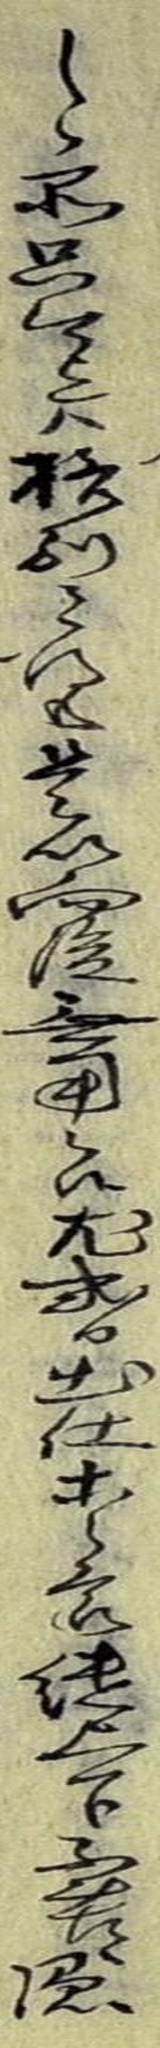し候品只今迄ハ格別ニ候得共是以向後無用ニ候尤式日出仕等之節継上下不苦候隠
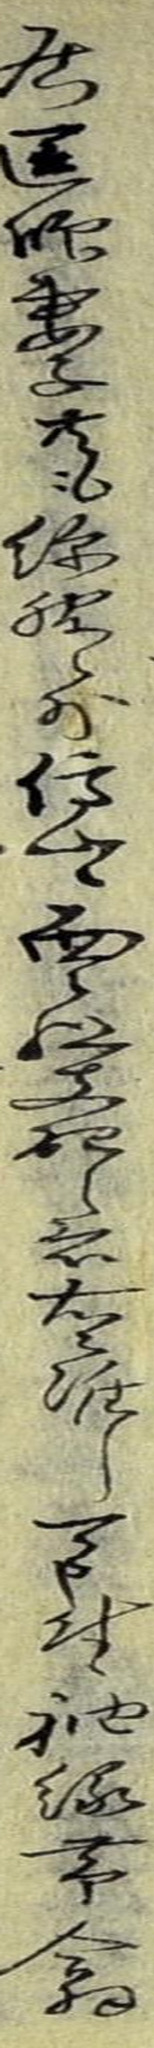居医師妻子共も綿服之外停止候面々組支配之者右ニ准し可申付候袖縁帯合羽
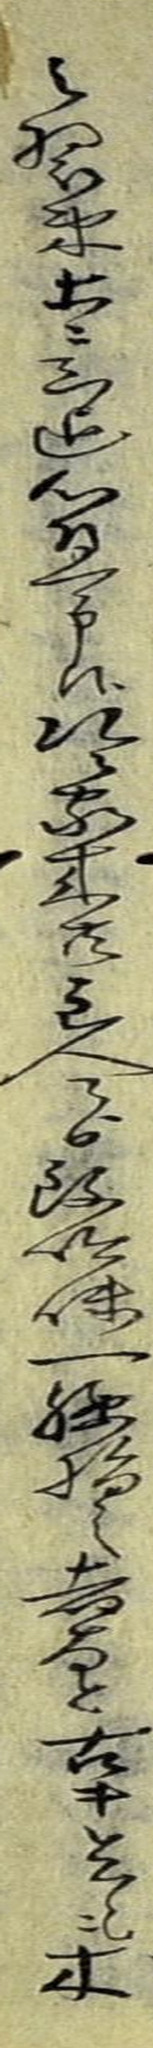之装束等ニ至迄心付可申候次ニ家来共主人ゟ致吟味一腰指之者なと古キとても木
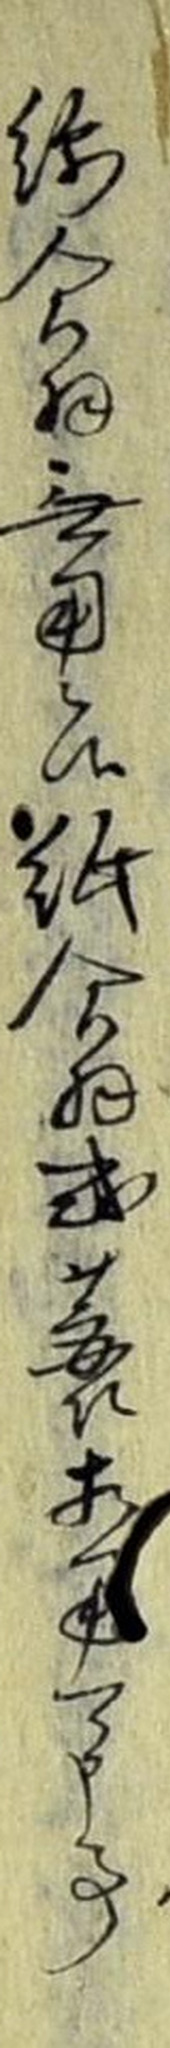綿合羽無用ニ候紙合羽或蓑相用可申事
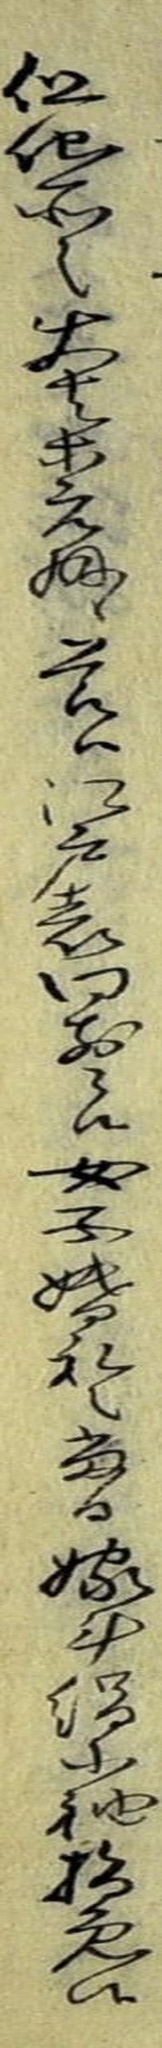但他所之使者等取扱候節ハ江戸表同前ニ候女子婚礼之当日嫁斗絽小袖指免候
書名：命令之部 一
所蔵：福井県文書館 Fukui Prefectural Archives
